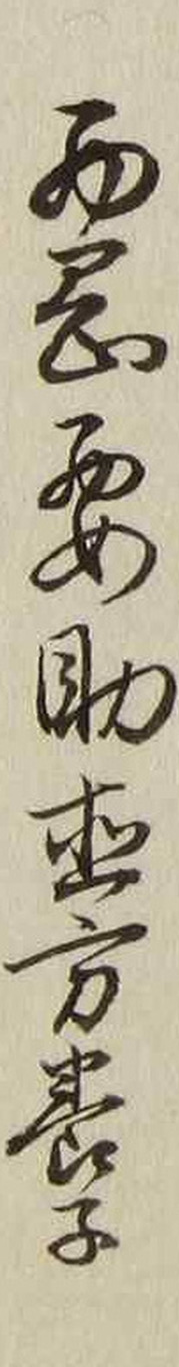西岡要助直方養子
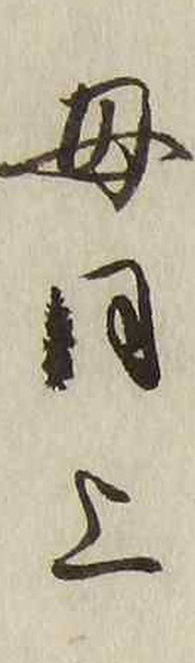母同上

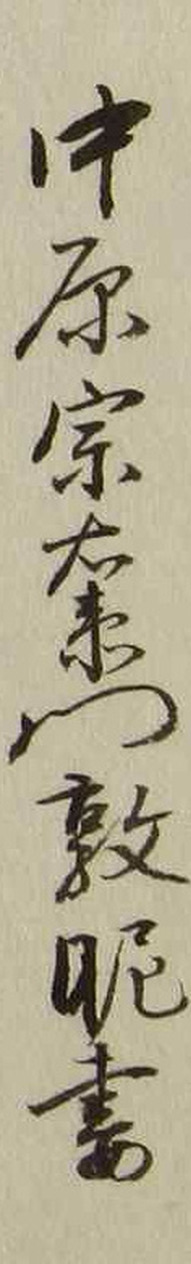女中原宗右衛門敦昵
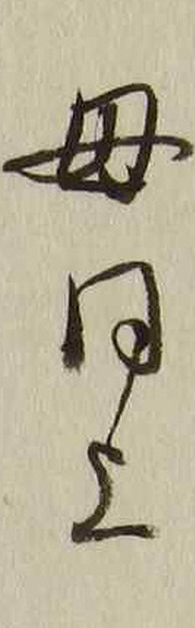母同上
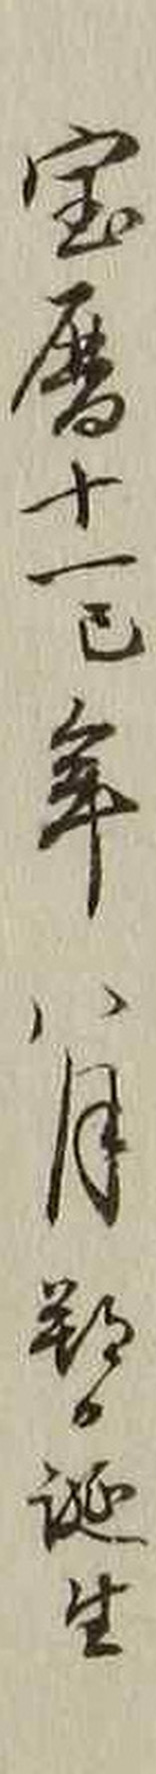宝暦十一巳年八月朔日誕生
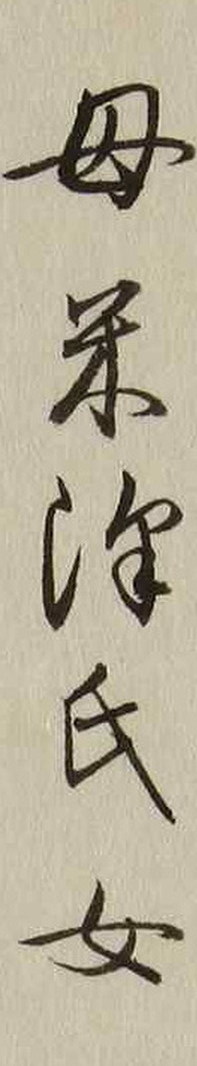母米沢氏女
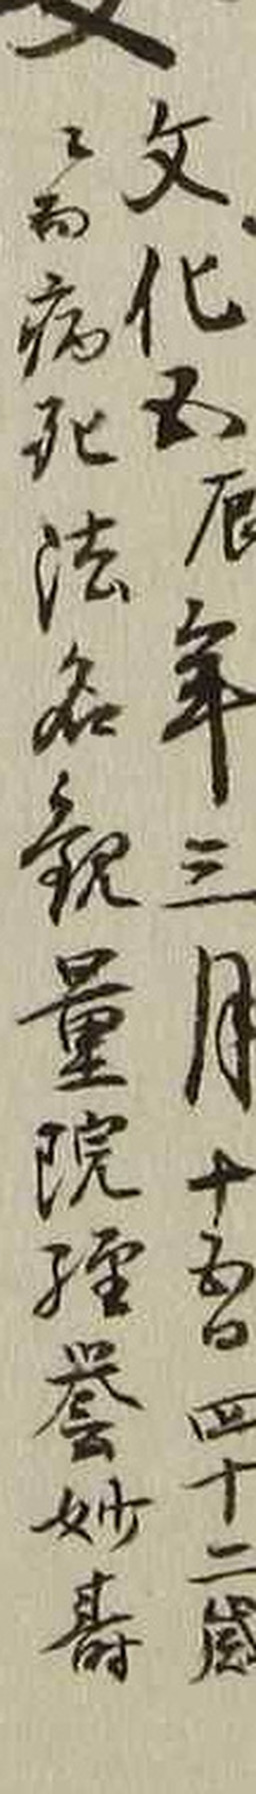ニ而病死法名観量院経誉妙寿
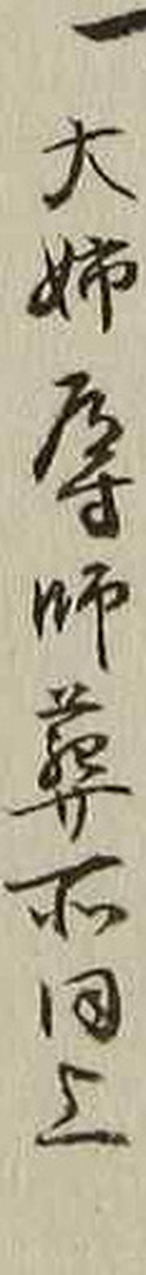大姉導師葬所同上
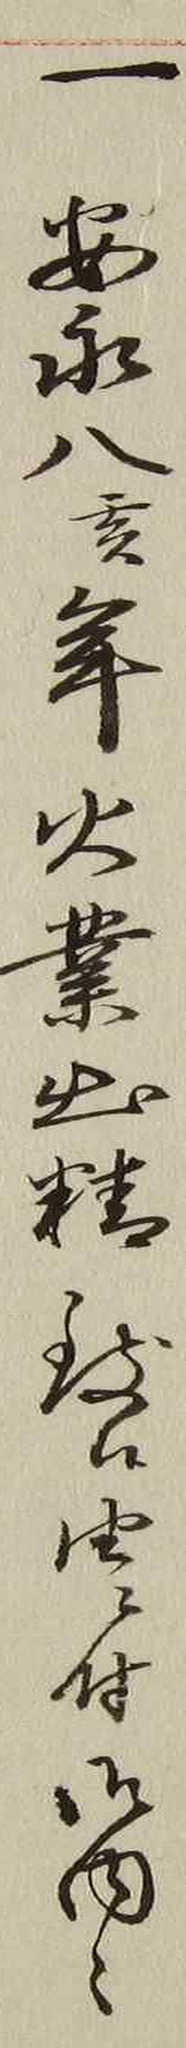一安永八亥年火業出精致候由ニ付御内々
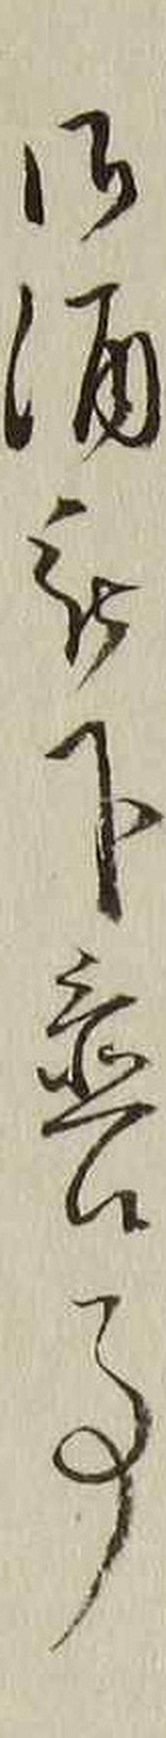御酒被下置候事
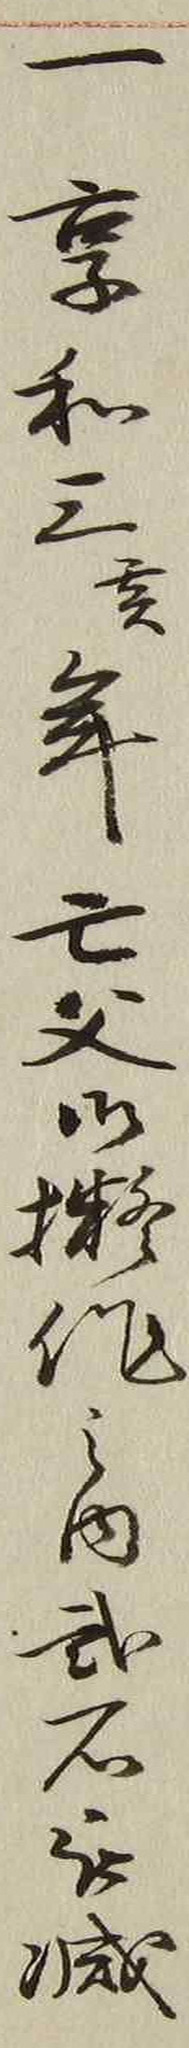一享和三亥年亡父御擬作之内弐石被減
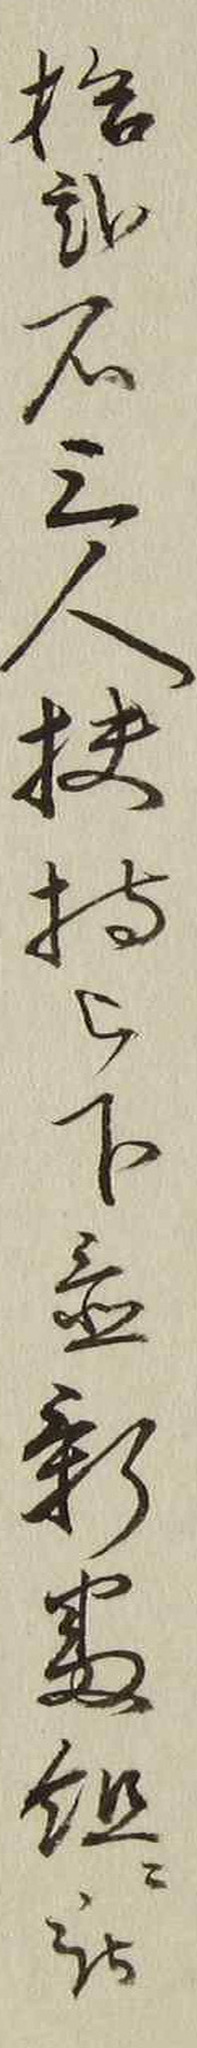拾弐石三人扶持被下置新番組ニ被
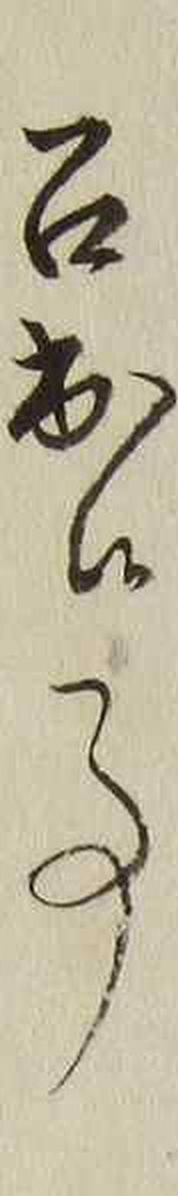召出候事
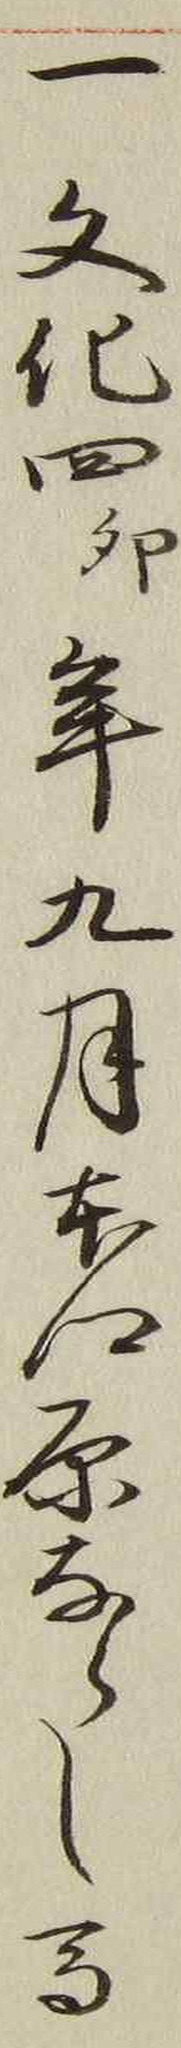一文化四夘年九月本郷原ならし馬
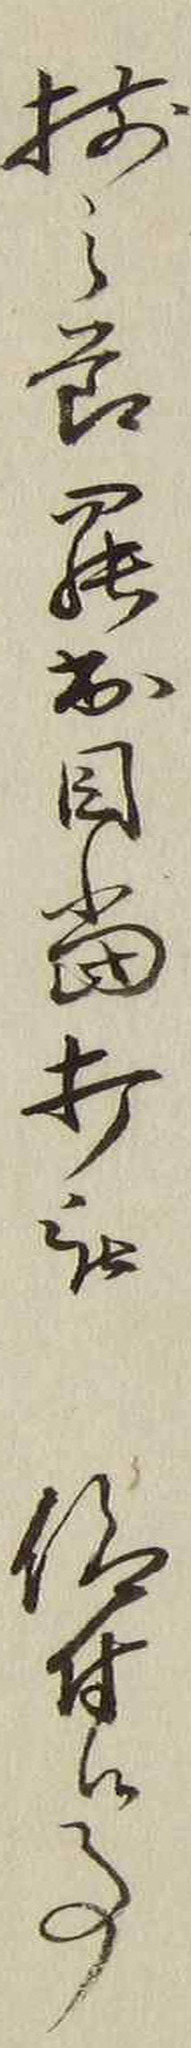揃之節罷出目当打被仰付候事
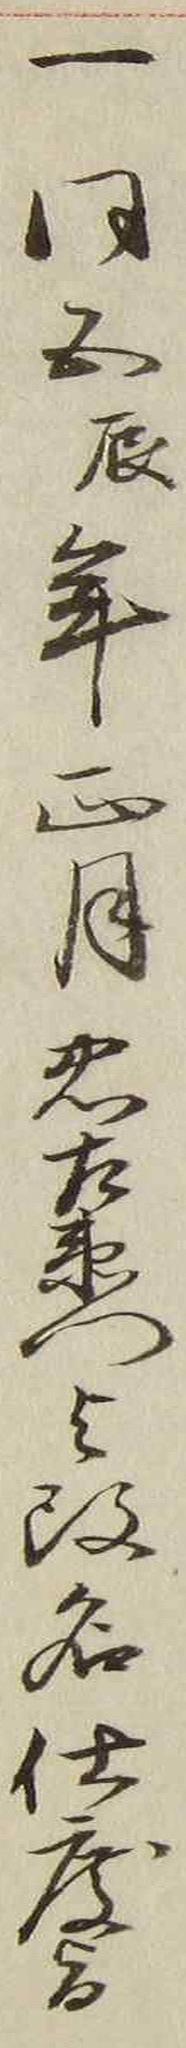一同五辰年正月忠左衛門と改名仕度旨
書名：諸士系譜　巻之114　か之部22
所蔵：会津若松市立会津図書館
